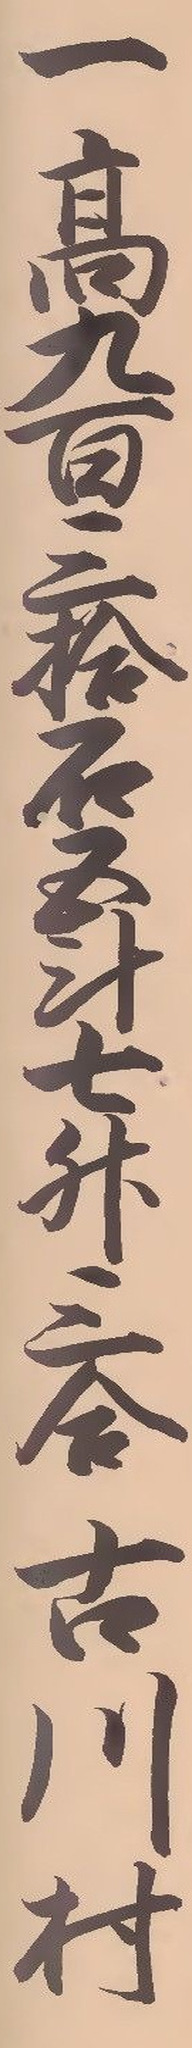一高九百三拾石五斗七升三合古川村
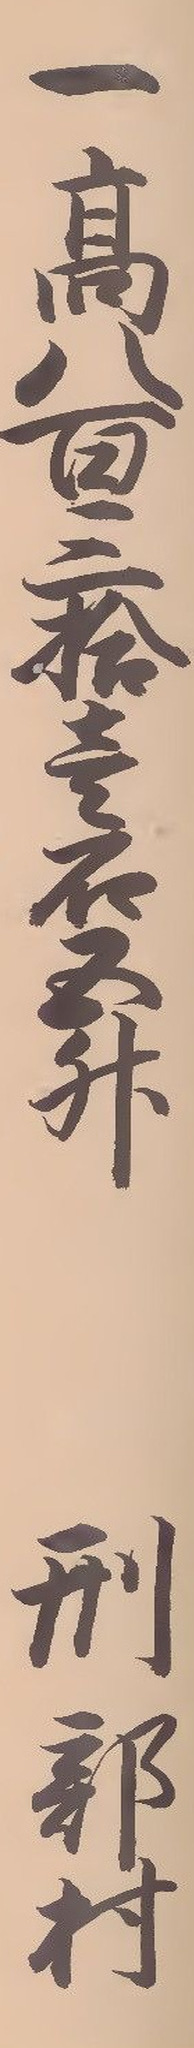一高八百三拾壱石五升刑部村
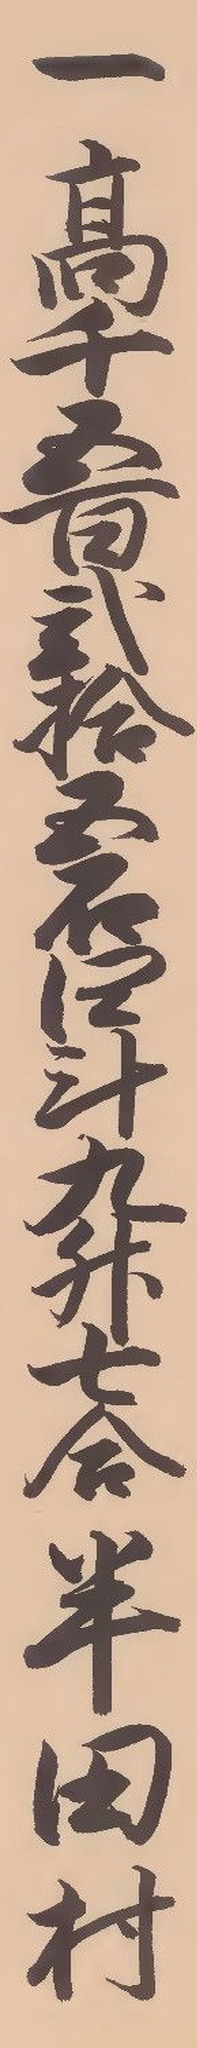一高千五百弐拾五石四斗九升七合半田村
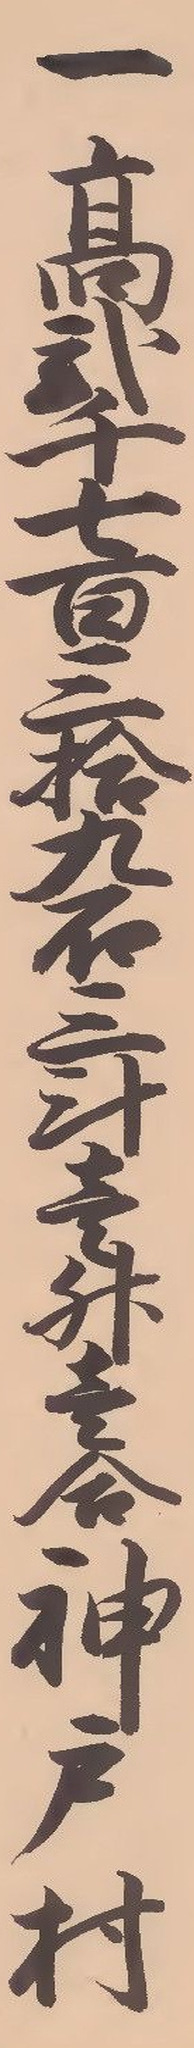一高弐千七百三拾九石三斗壱升壱合神戸村
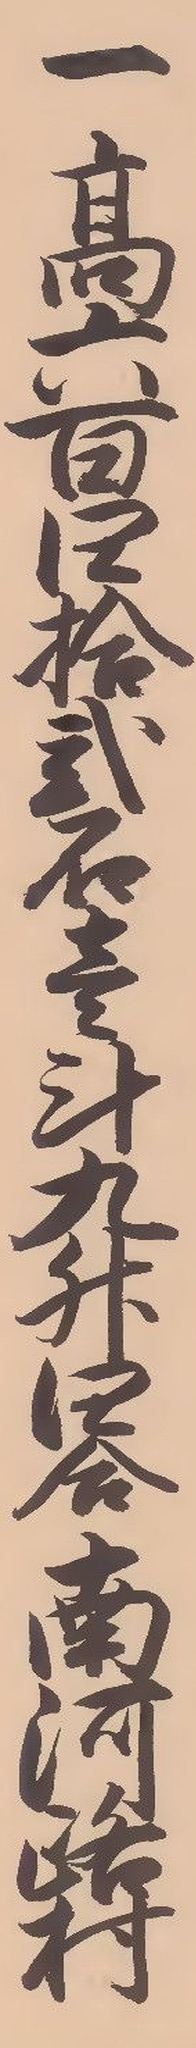一高六百四拾弐石壱斗九升四合南河路村

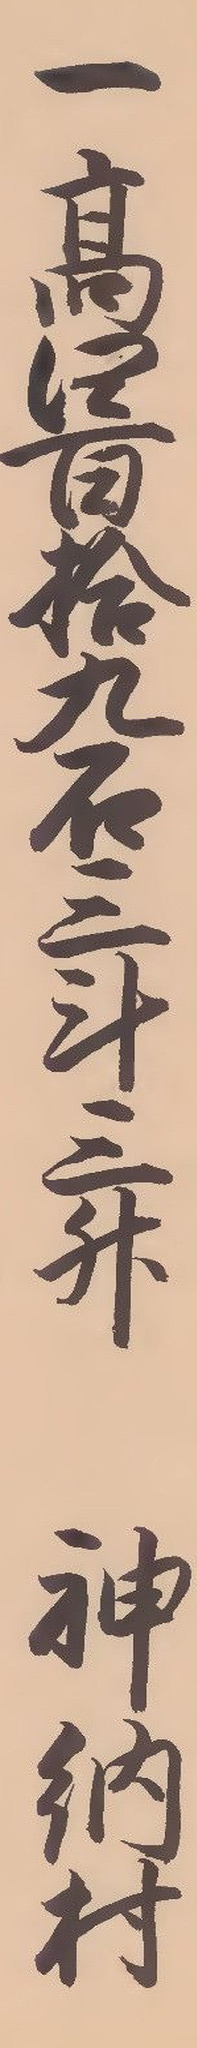一高四百拾九石三斗三升神納村
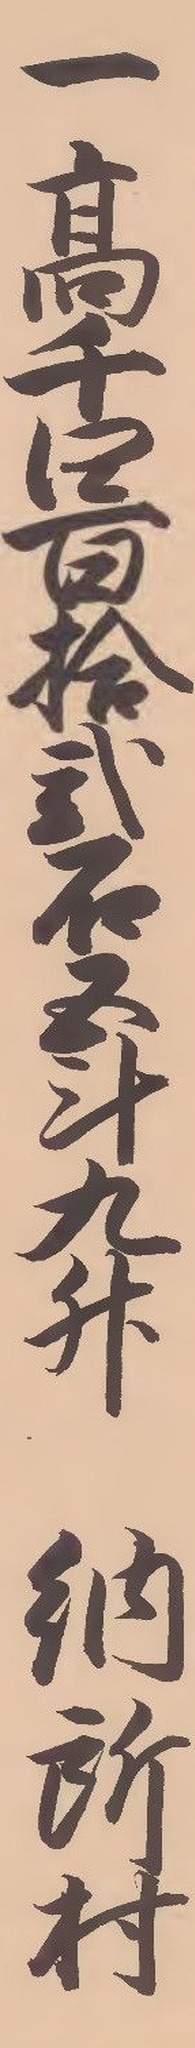一高千四百拾弐石五斗九升納所村
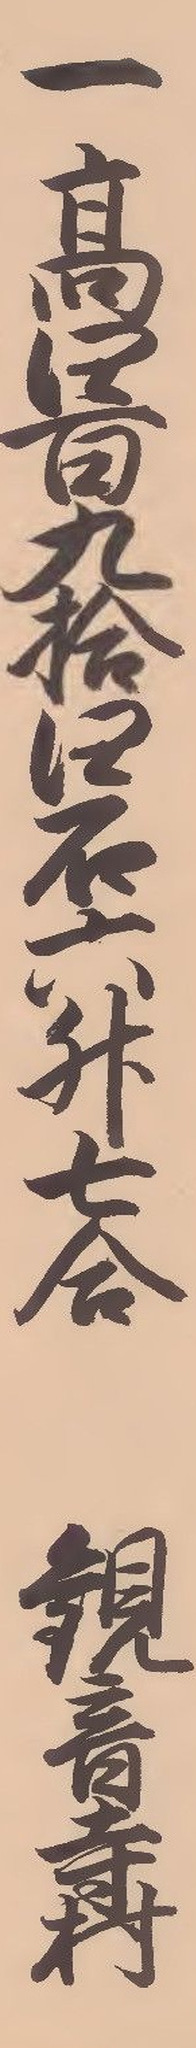一高四百九拾四石六升七合観音寺村
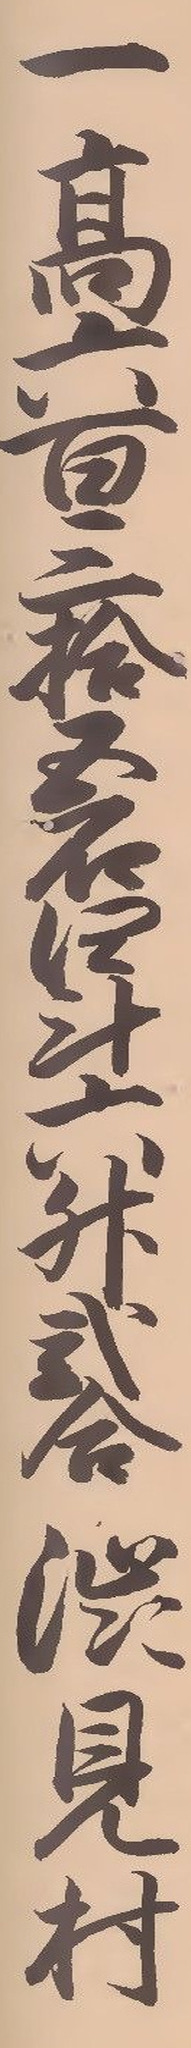一高六百三拾五石四斗六升弐合渋見村
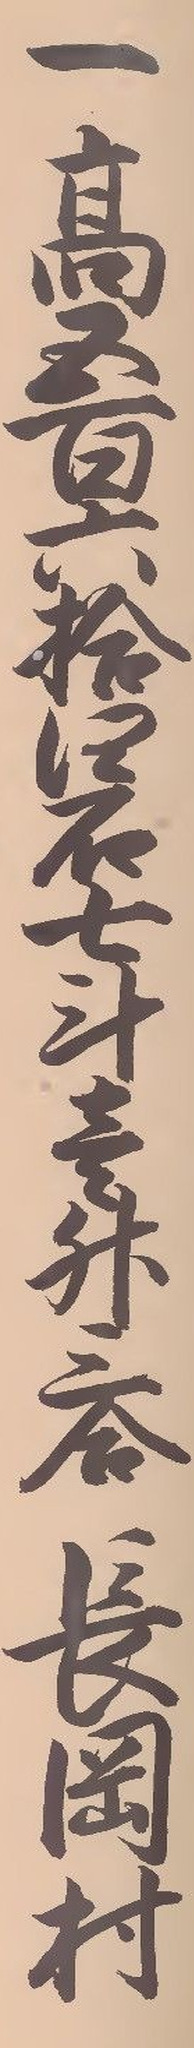一高五百六拾四石七斗壱升三合長岡村
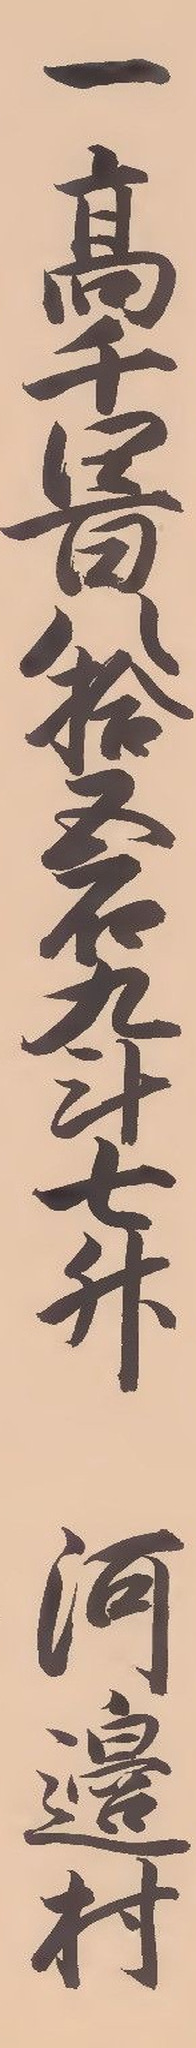一高千四百八拾五石九斗七升河辺村
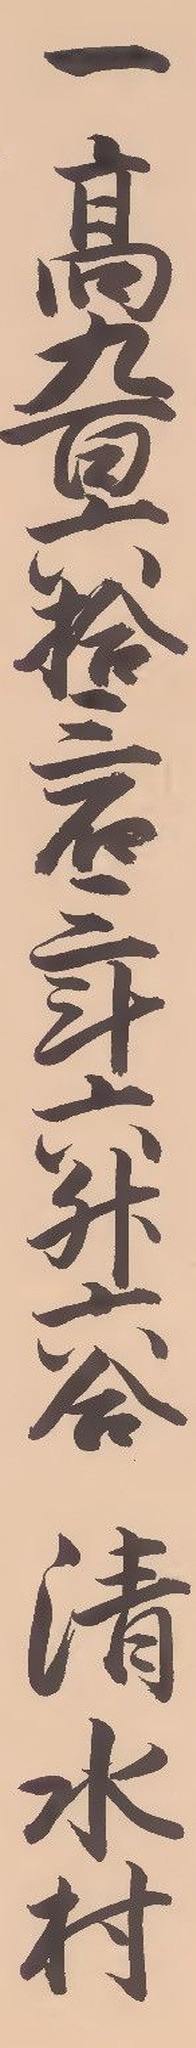一高九百六拾三石三斗六升六合清水村
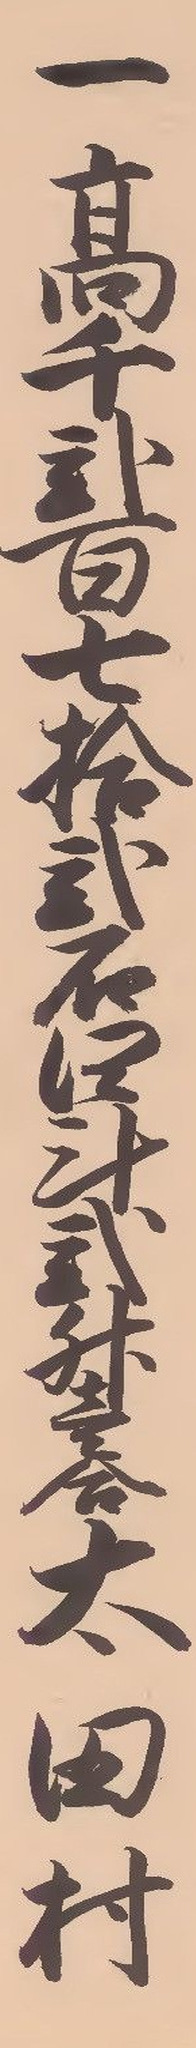一高千弐百七拾弐石四斗弐升壱合太田村

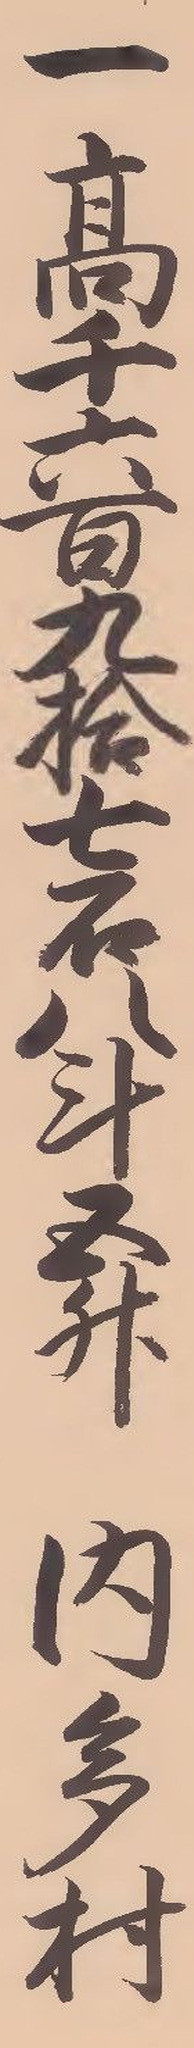一高千六百九拾七石八斗五升内多村
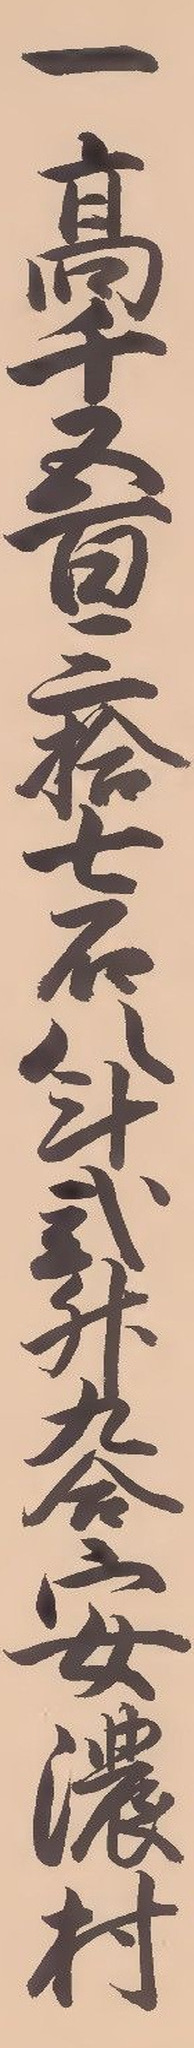一高千五百三拾七石八斗弐升九合安濃村
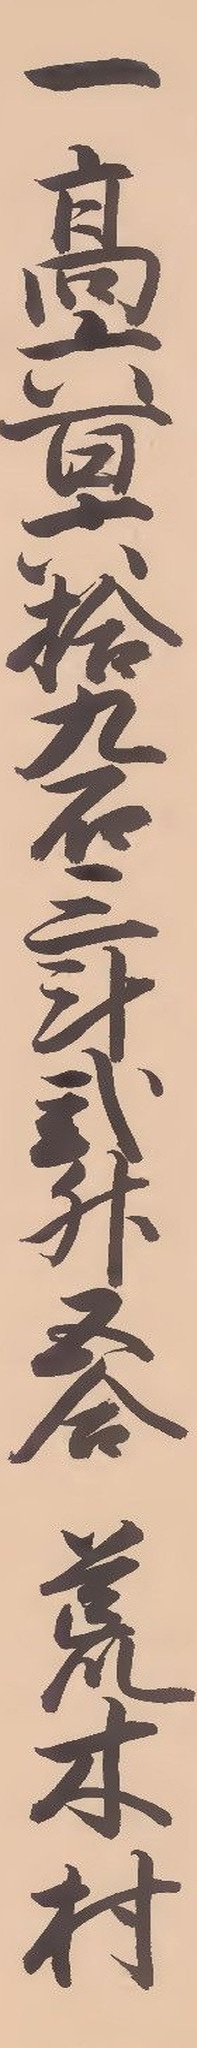一高六百六拾九石三斗弐升五合荒木村
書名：伊勢国郷帳
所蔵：国立公文書館 National Archives of Japan
